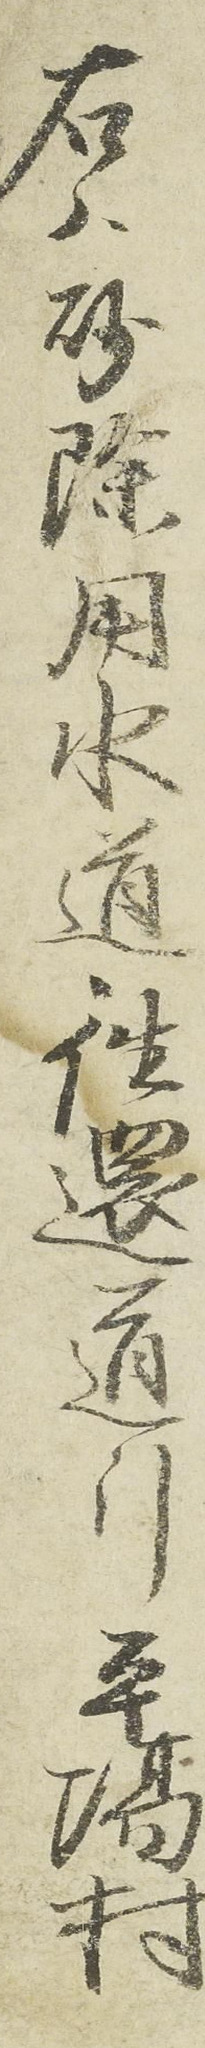右ハ砂除用水道往還通行平場村

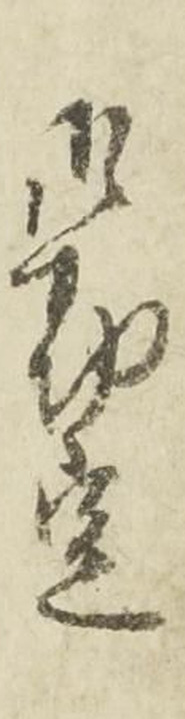御勘定
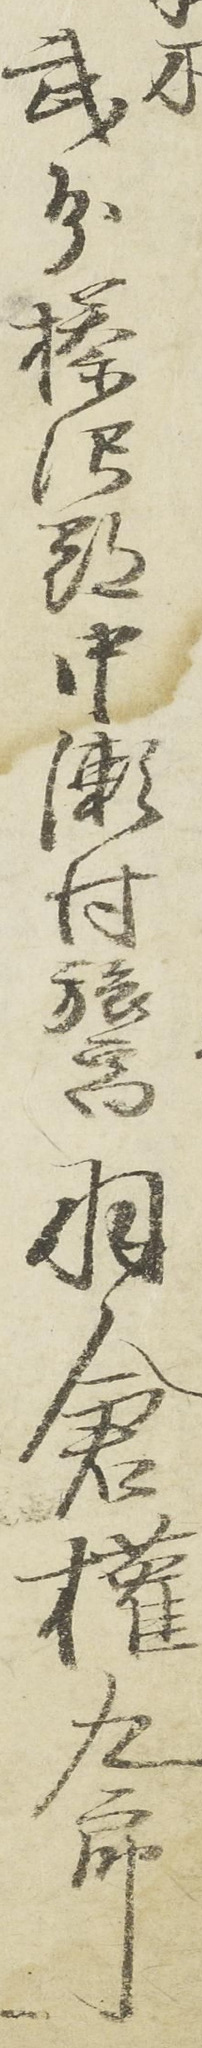武州榛沢郡中瀬村旅宿羽倉権九郎
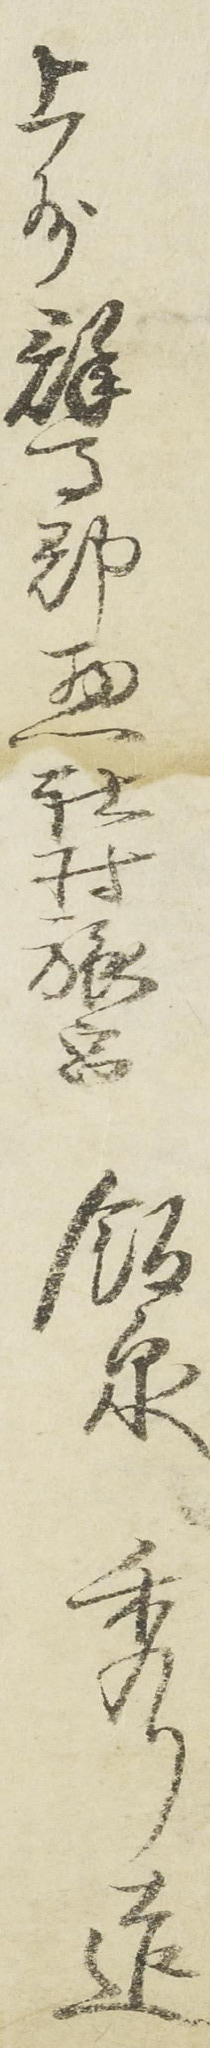上州群馬郡惣社村旅宿飯泉秀ノ進
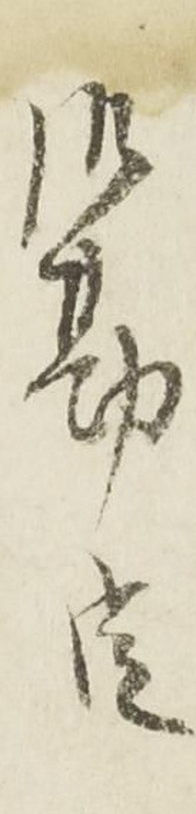御勘定
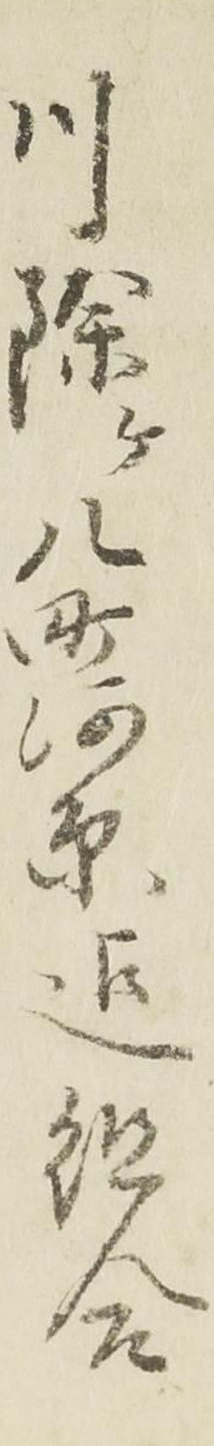川除ケ八町河原迄組合
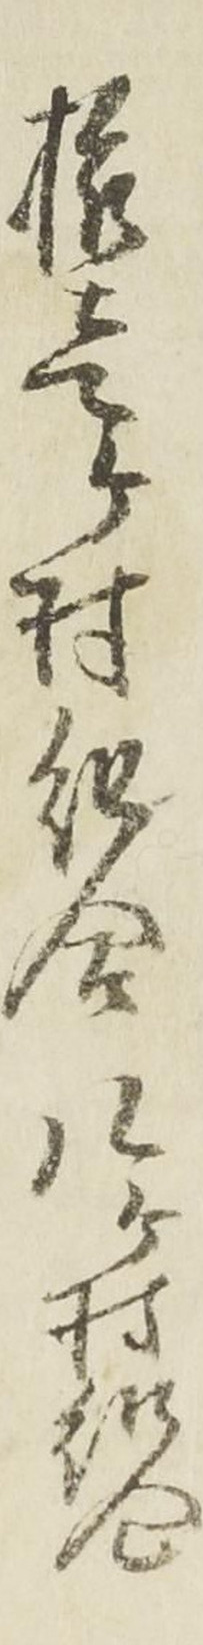拾壱ケ村組合八ケ村組合
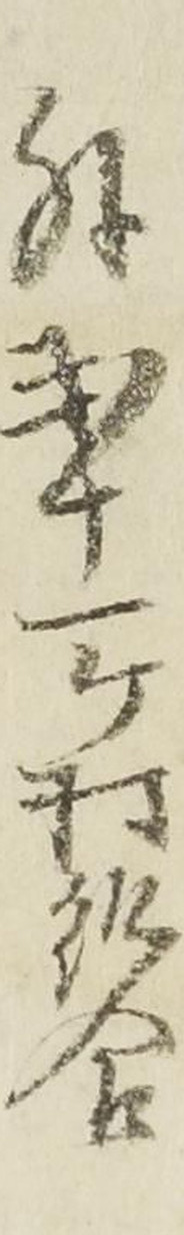外弐十一ケ村組合
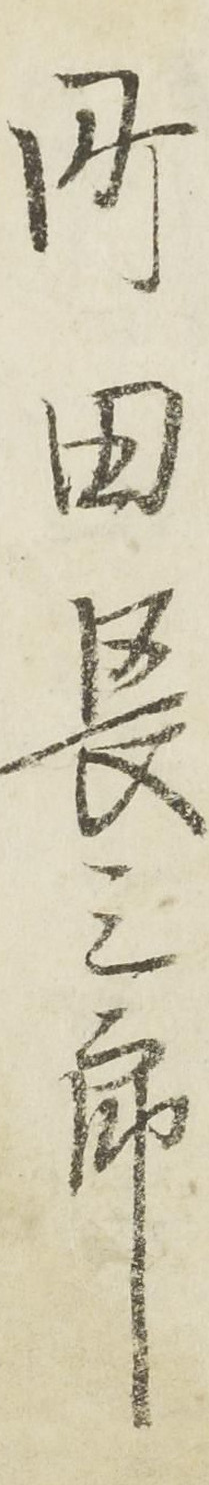町田長三郎
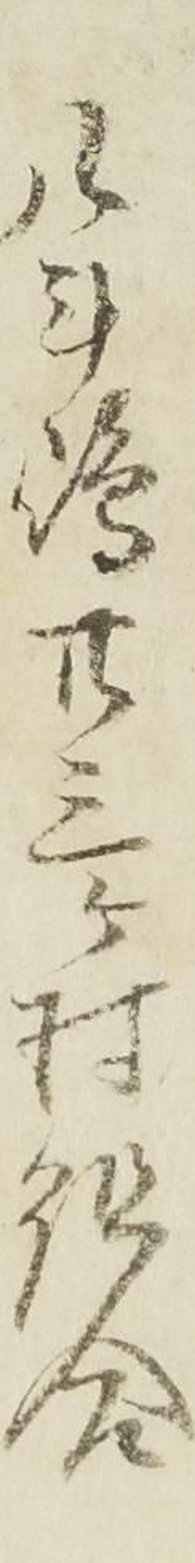八斗嶋廿三ケ村組合
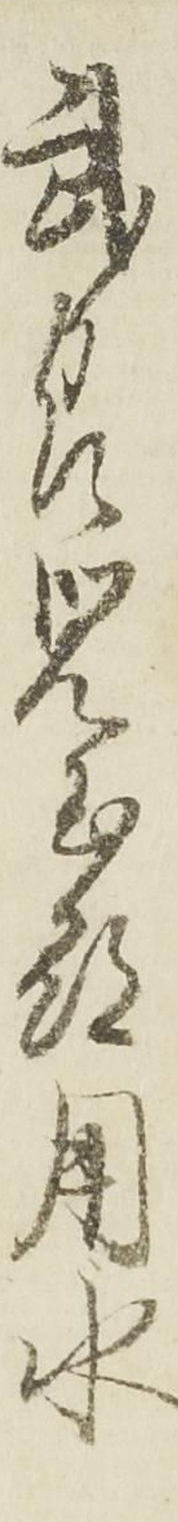武州児玉郡用水
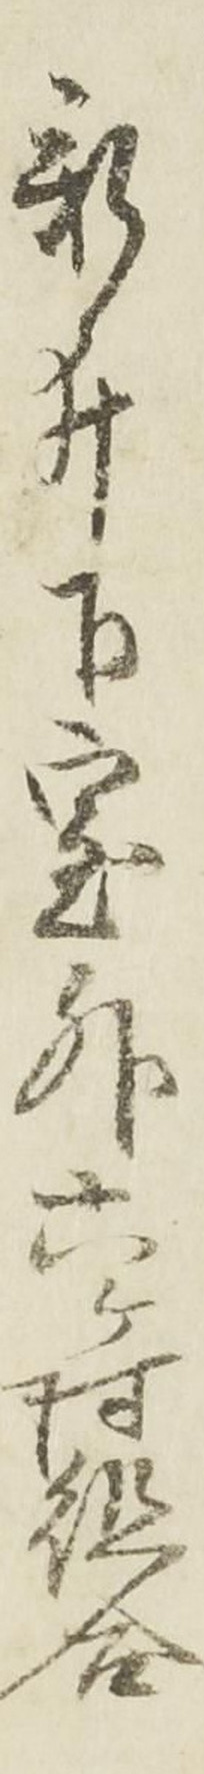新井下室外六ケ村組合
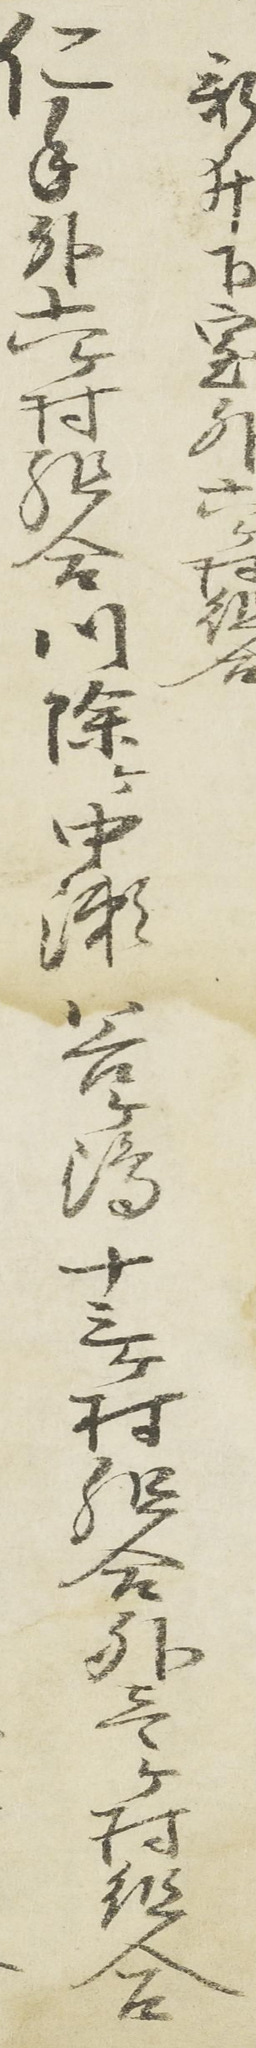仁手外六ケ村組合川除中瀬谷ケ嶋十三ケ村組合外壱ケ村組合
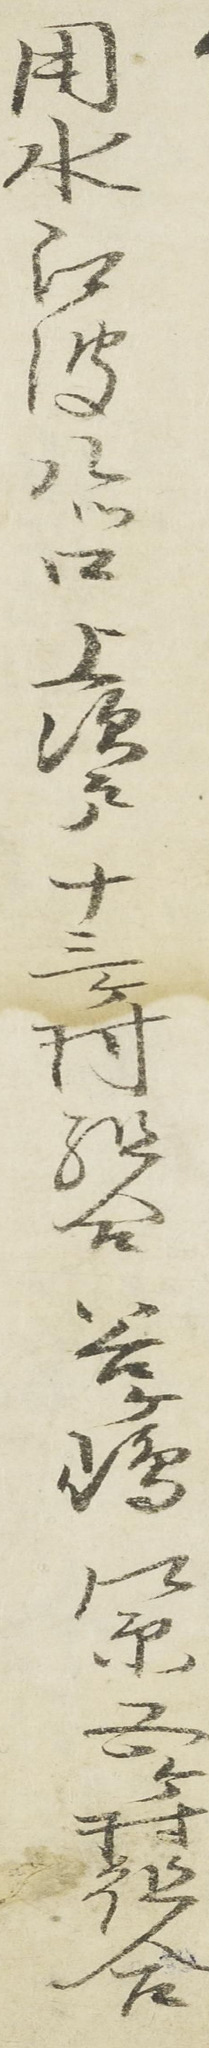用水江波八ツ口上須戸十三ケ村組合谷ケ嶋郷原五ケ村組合
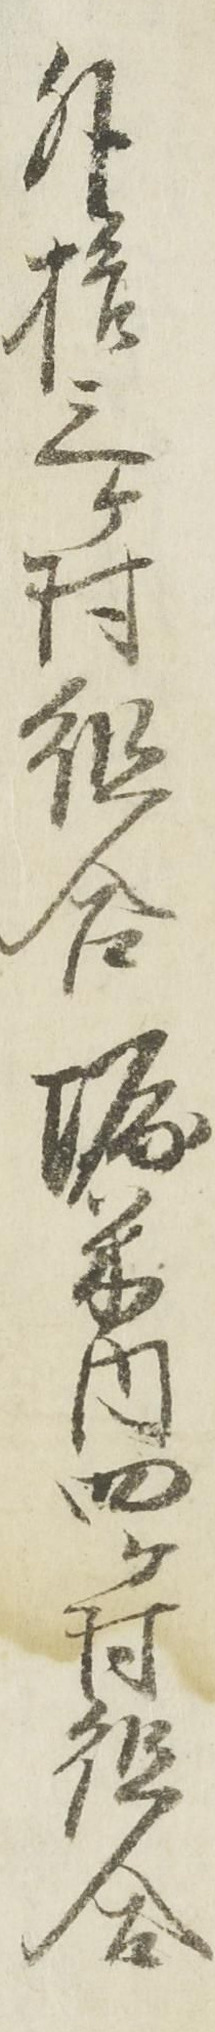外拾三ケ村組合堀米内四ケ村組合
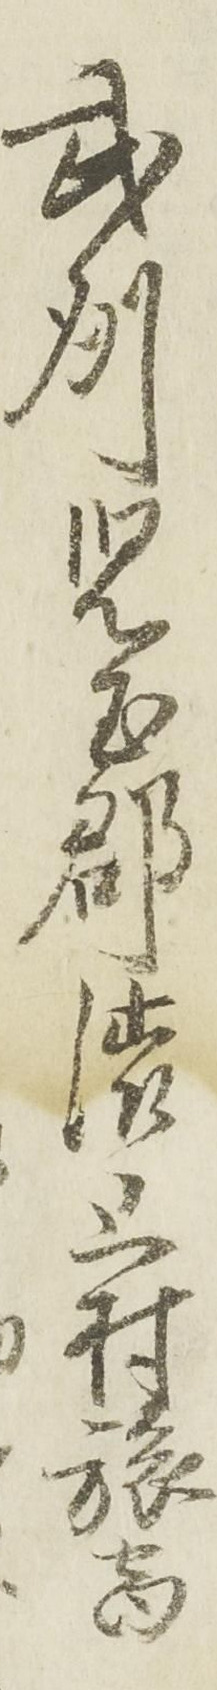武州児玉郡渋上村旅宿
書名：浅間大変略記
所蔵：東京大学地震研究所図書室 Earthquake Research Institute Library, The University of Tokyo, JAPAN
